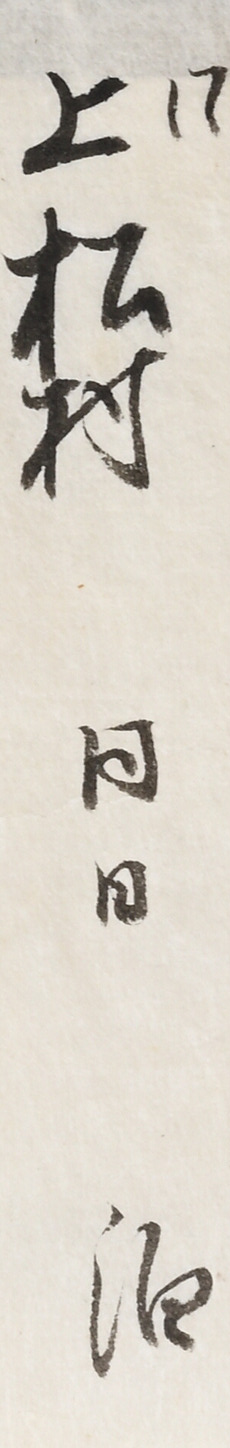上松村月日泊
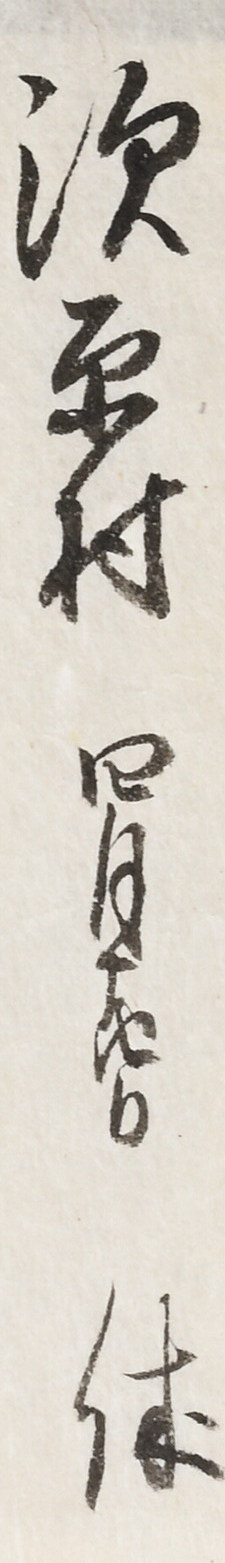須原村四月十四日休
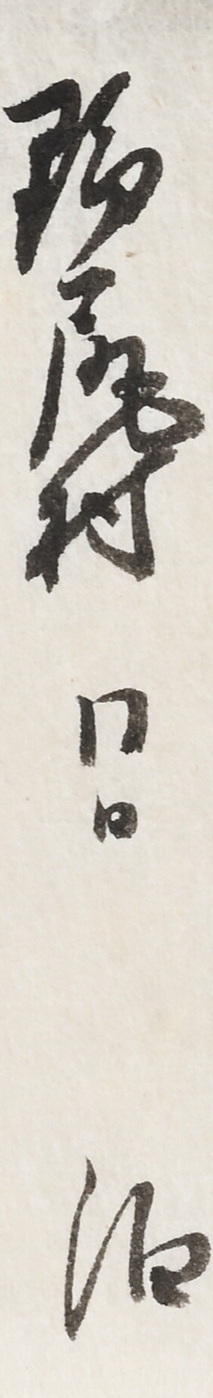野尻村同日泊
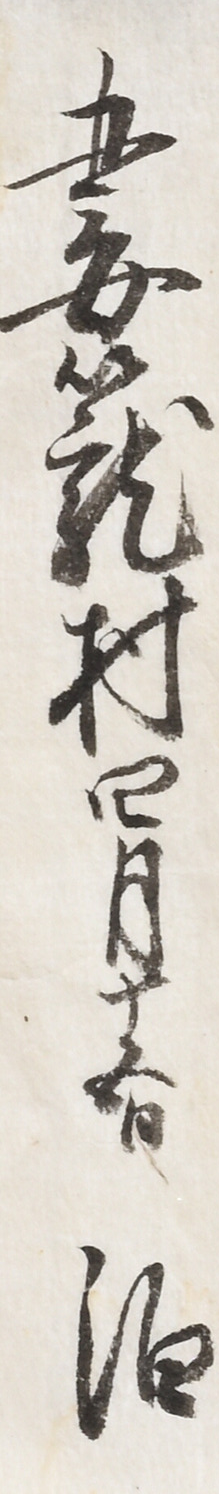妻籠村四月十五日泊
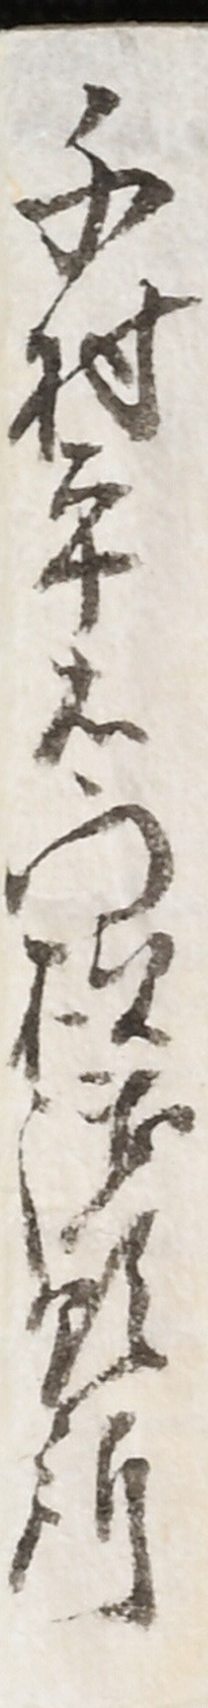千村平右衛門様御領所
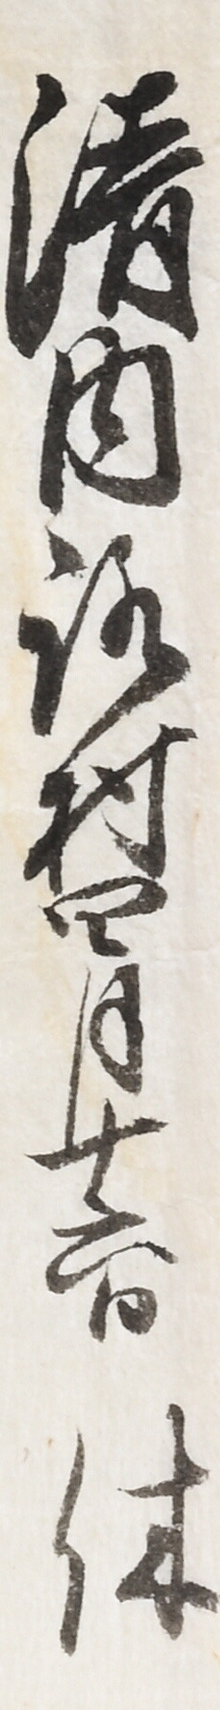清内路村四月十六日休
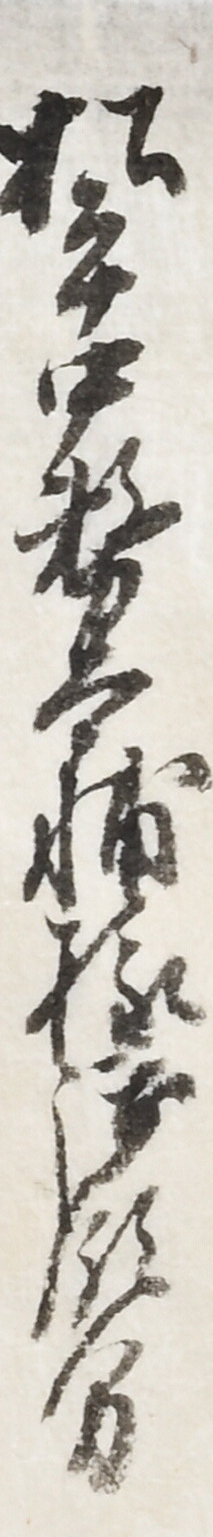松平中務太輔様御領分
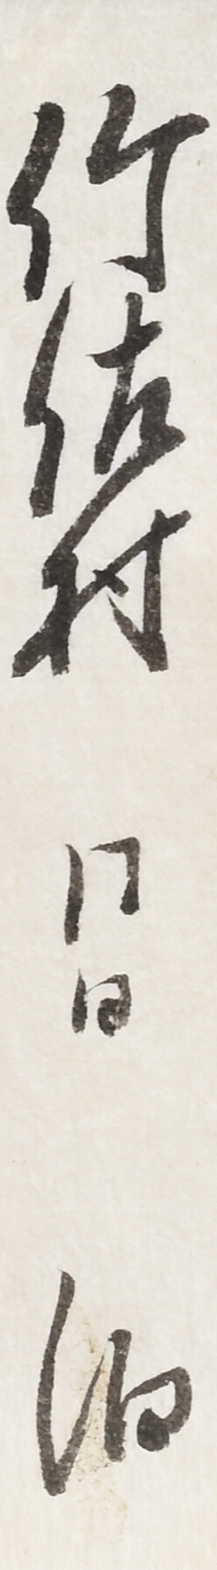竹佐村同日泊
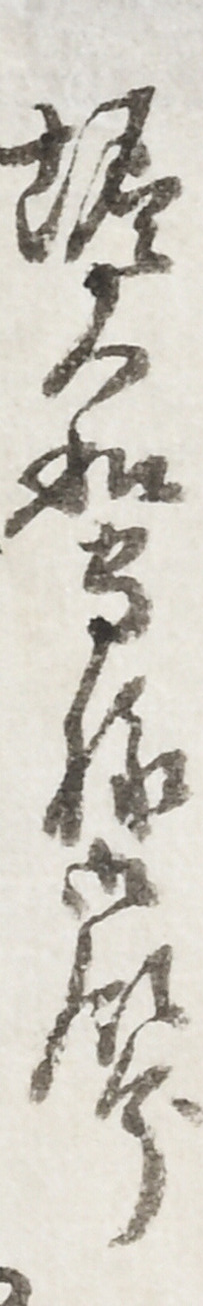堀大和守様御領分
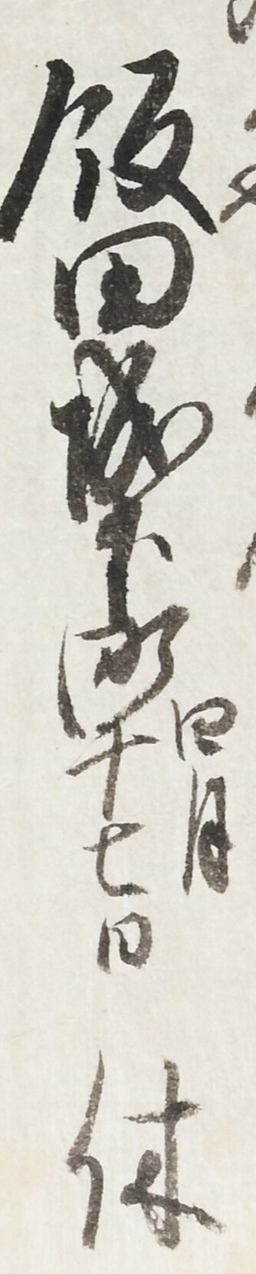飯田城下町十七日休
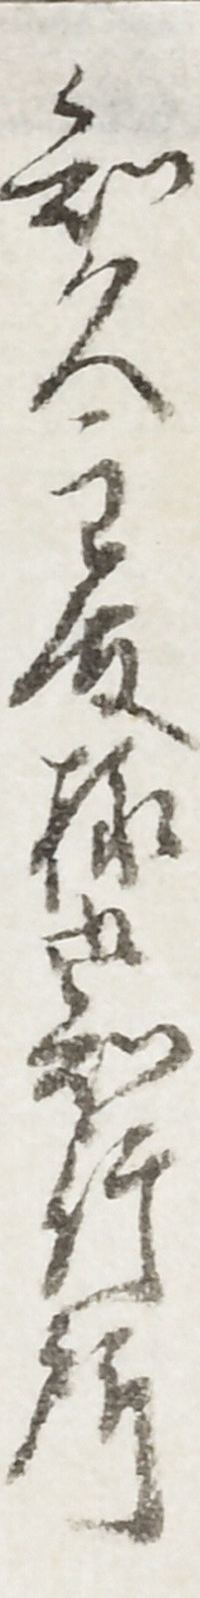知久主殿様御知行所
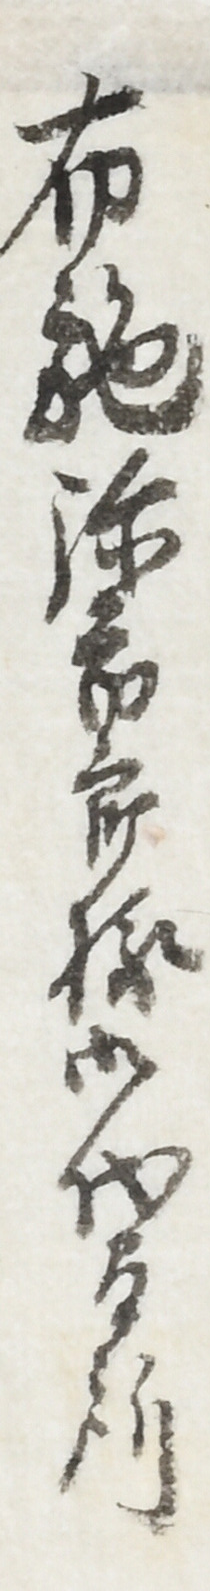布施弥市郎様御代官所
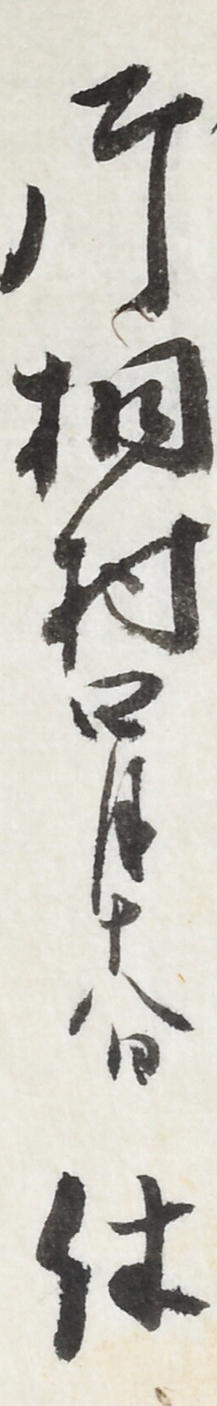片桐村四月十八日休

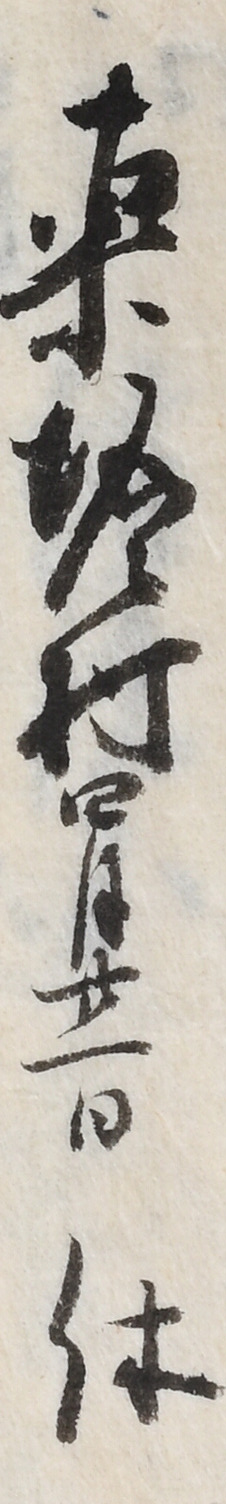麻続村四月廿三日休
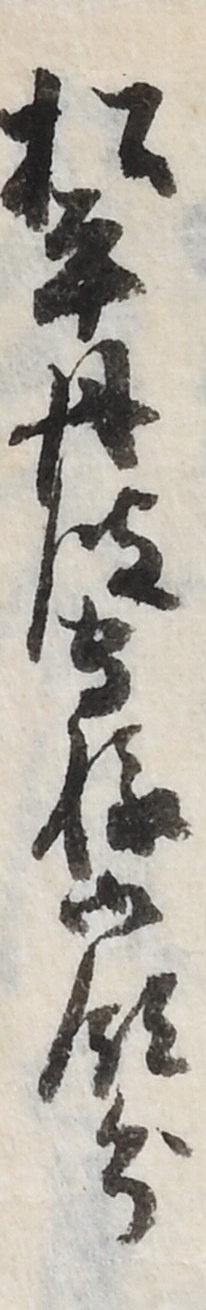松平丹波守様御領所
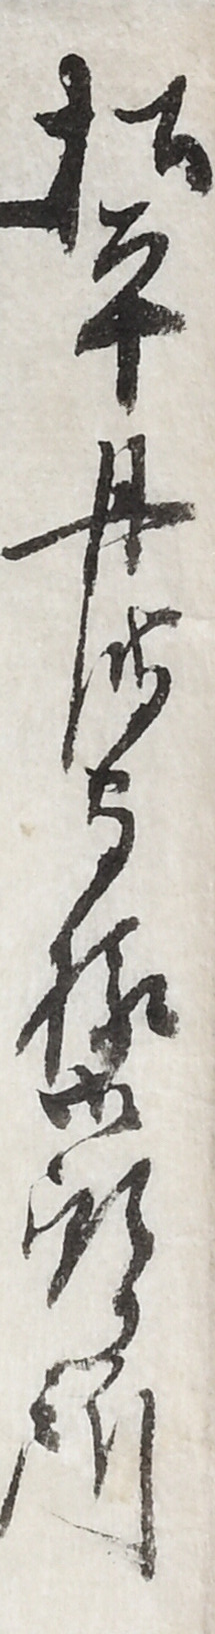松平丹波守様御領所
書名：御巡見様御先觸之写
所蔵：伊那市立高遠町図書館・合同会社AMANE
